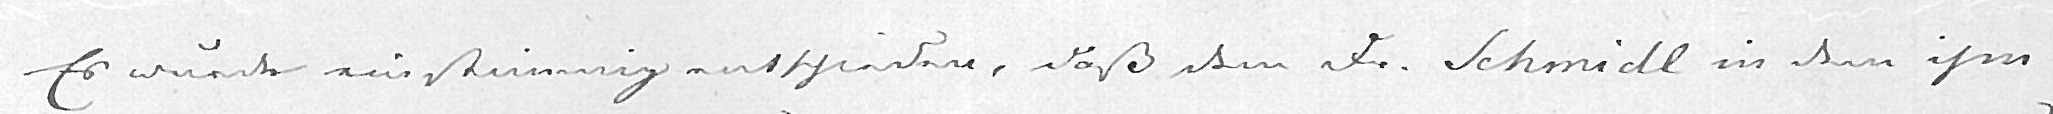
Es wurde einstimmig entschieden, daß dem Dr. Schmidl in dem ihm
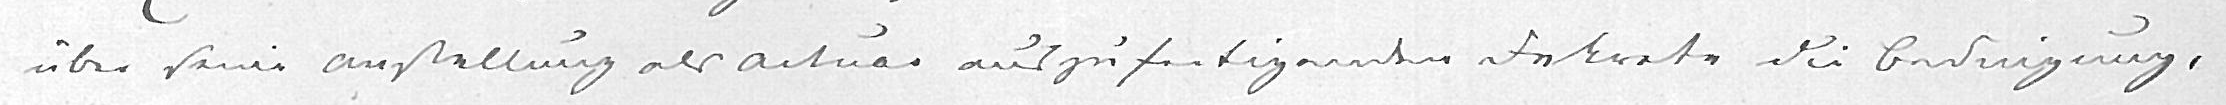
über seine Anstellung als Actuar auszufertigenden Dekrete die Bedingung,
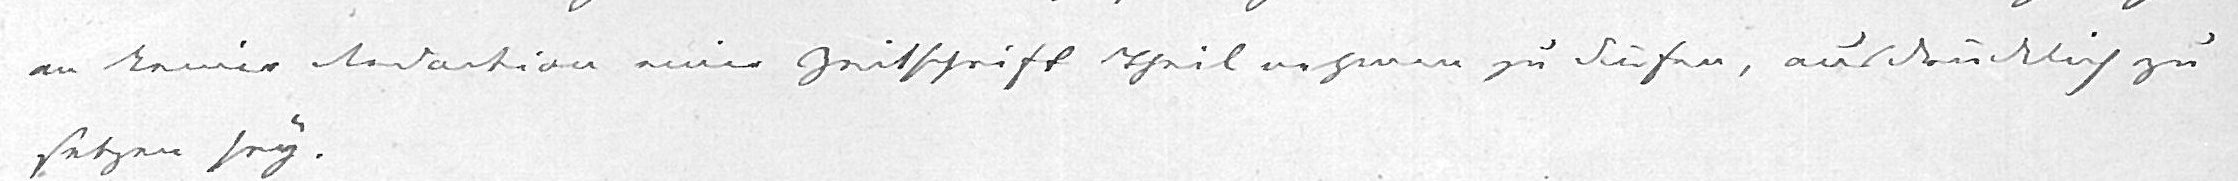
an keiner Redaction einer Zeitschrift Theil nehmen zu dürfen, ausdrücklich zu
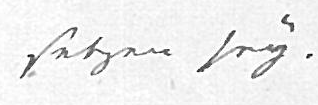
setzen sey.
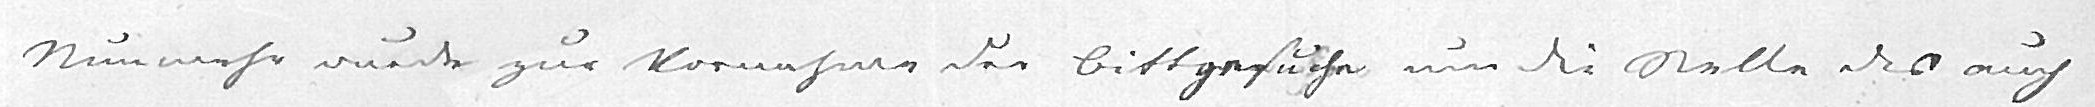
Nunmehr wurde zur Vornahme der Bittgesuche um die Stelle des auch
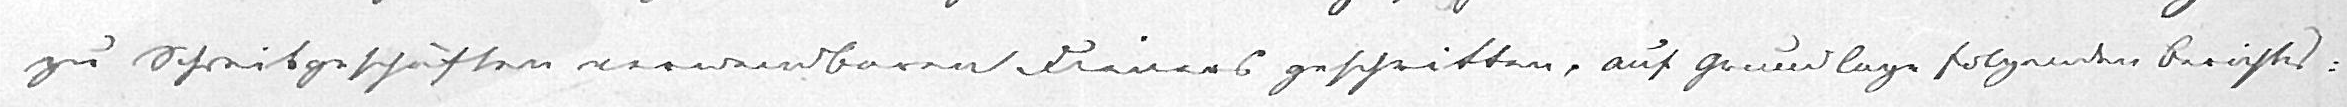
zu Schreibgeschäften verwendbaren Dieners geschritten, auf Grundlage folgenden Berichtes:
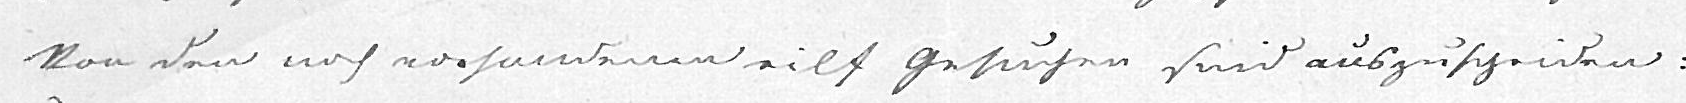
Von den noch vorhandenen eilf Gesuchen sind auszuscheiden:
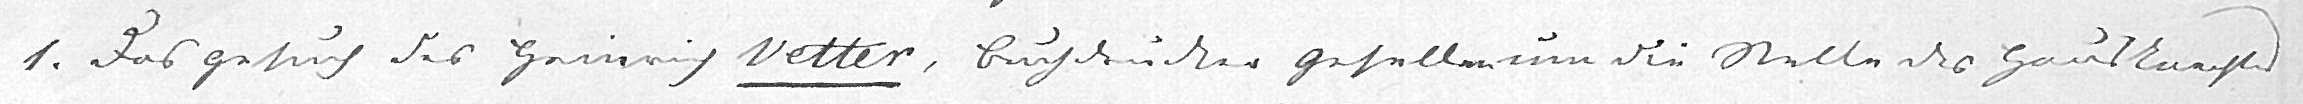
1. Das Gesuch des Heinrich Vetter, Buchdrucker Gesellen um die Stelle des Hausknechts.
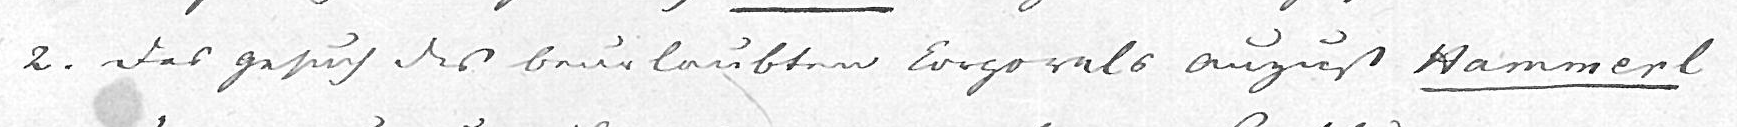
2. Das Gesuch des beurlaubten Corporals August Hammerl.
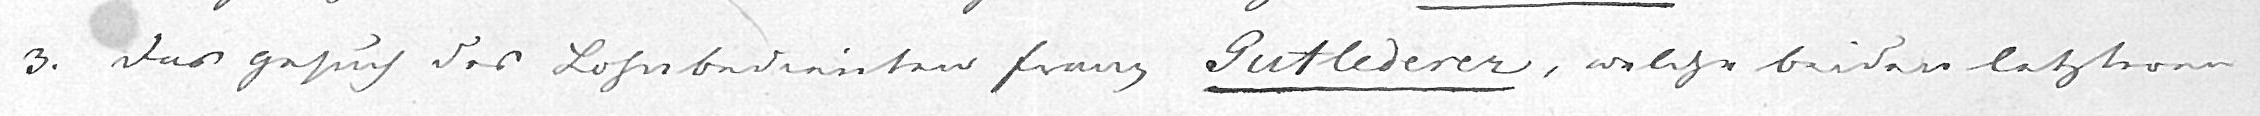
3. Das Gesuch des Lohnbedienten Franz Gutlederer, welche bei den letzteren
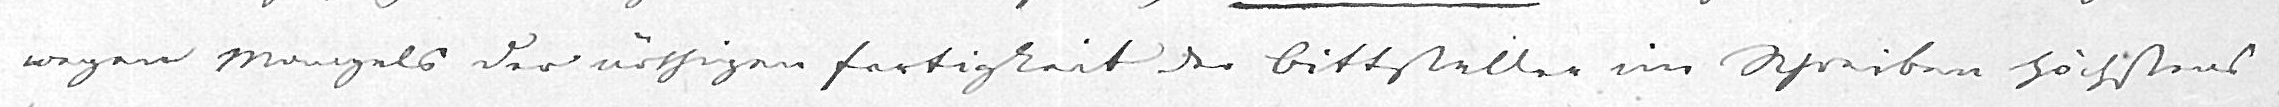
wegen Mangels der nöthigen Fertigkeit der Bittsteller im Schreiben höchstens
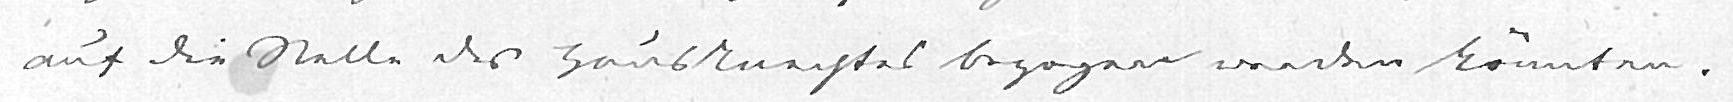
auf die Stelle des Hausknechtes bezogen werden könnten.
